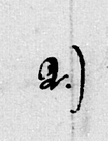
2.)
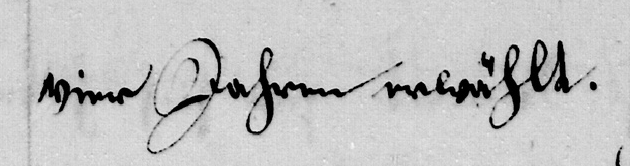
vier Jahren erwählt.
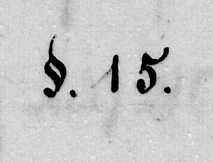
§.15.
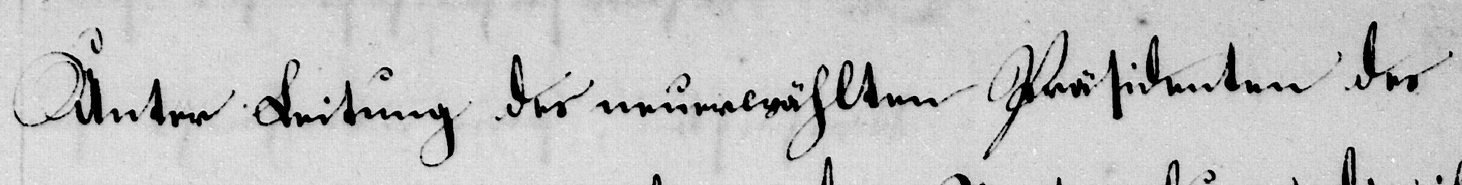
Unter Leitung des neuerwählten Präsidenten des
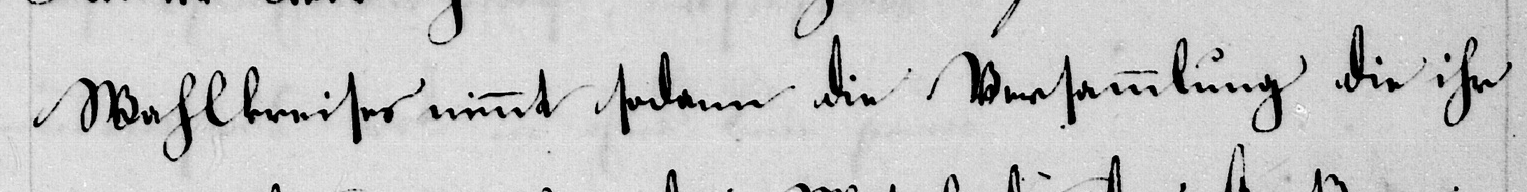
Wahlkreises nimmt sodann die Versammlung die ihr
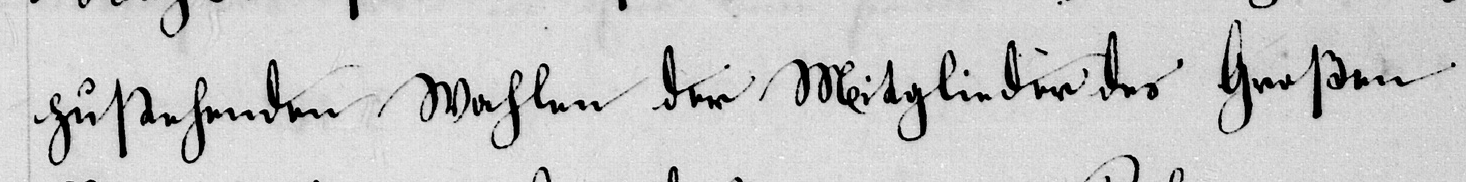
zustehenden Wahlen der Mitglieder des Großen
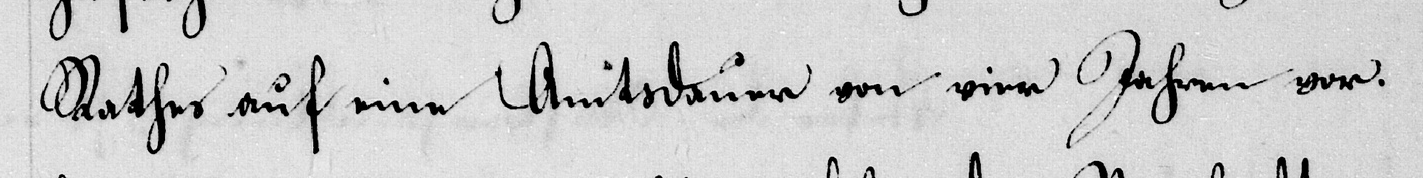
Rathes auf eine Amtsdauer vier Jahren vor.
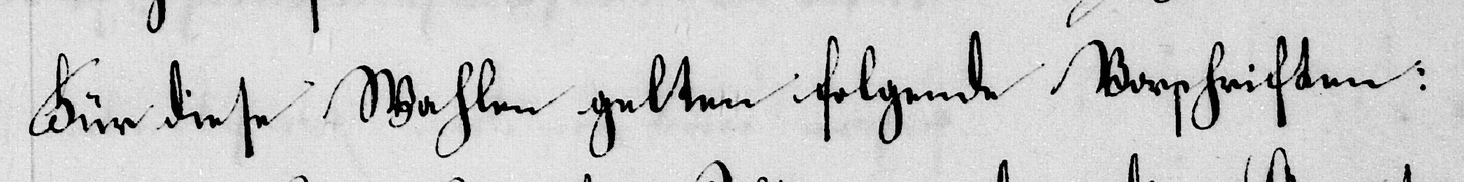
Für diese Wahlen gelten folgende Vorschriften:
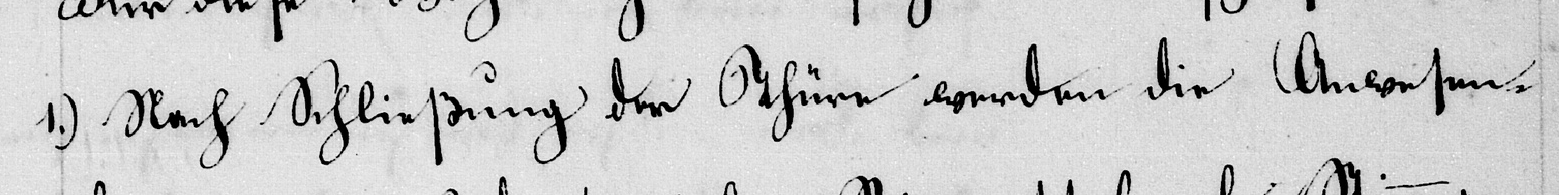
1.) Nach Schließung der Thüre werden die Anwesen¬
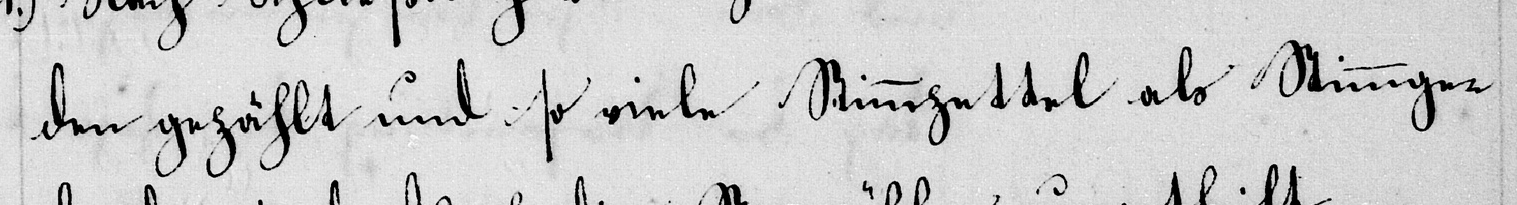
den gezählt und so viele Stimmzettel als Stimmge¬
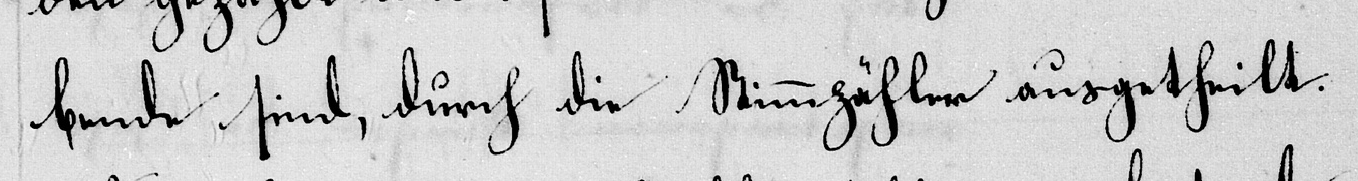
bende sind, durch die Stimmzähler ausgetheilt.
